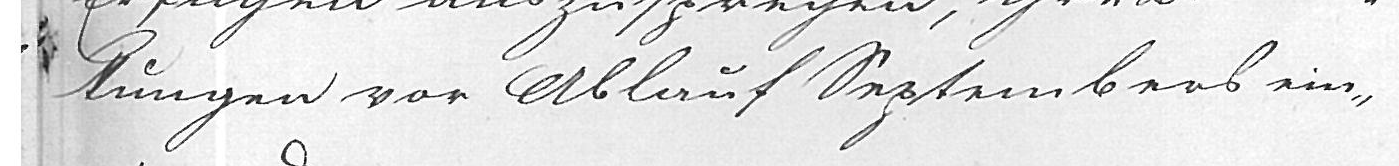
kungen vor Ablauf Septembers ein-
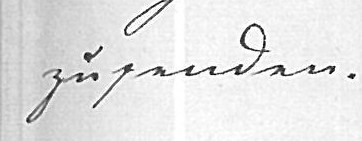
zusenden.
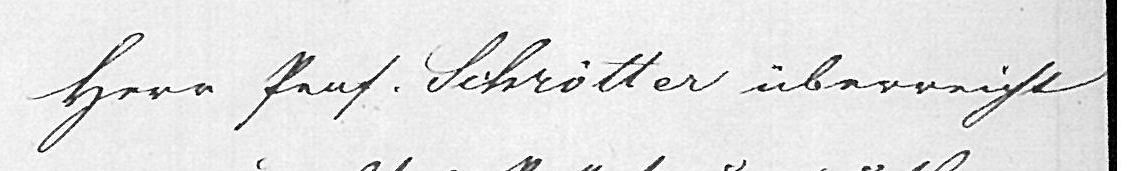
Herr Prof. Schrötter überreicht
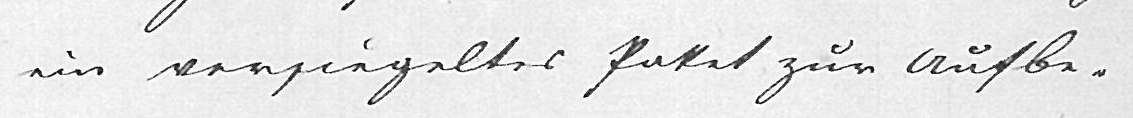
ein versiegeltes Paket zur Aufbe-
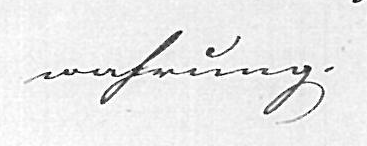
wahrung.
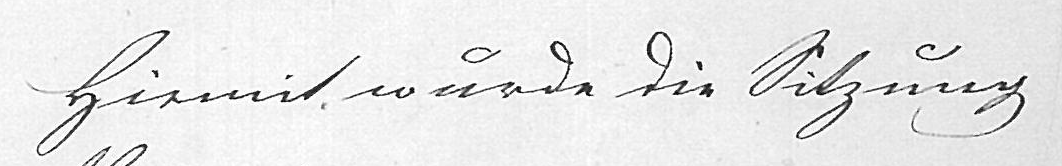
Hiemit wurde die Sitzung
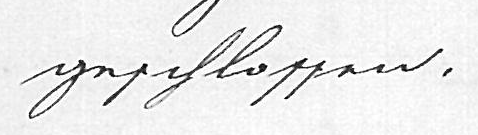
geschlossen.
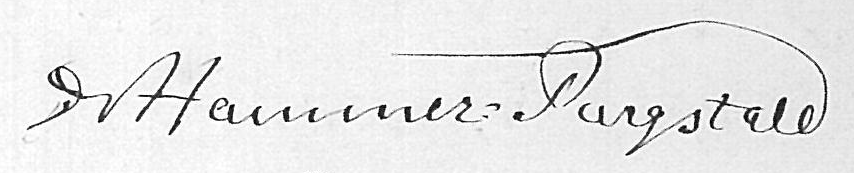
v.Hammer-Purgstall
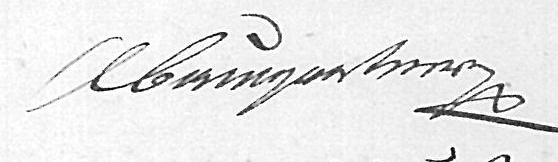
ABaumgartner
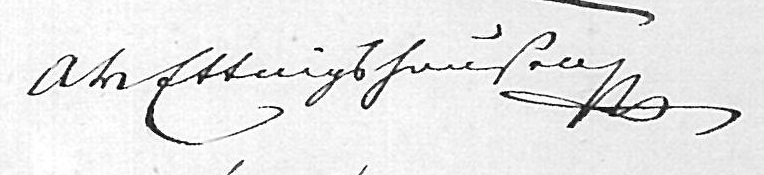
AvEttingshausen
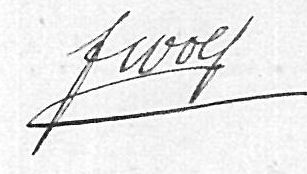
FWolf
